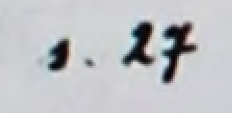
s. 27
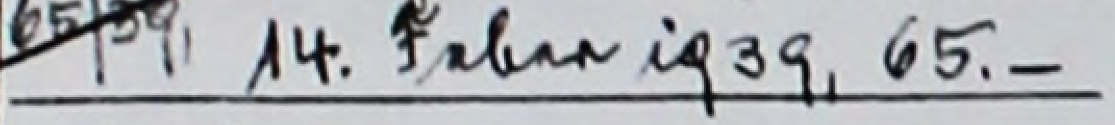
65/39 14. Feber 1939, 65.-
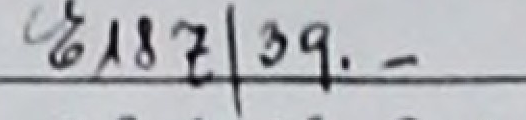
E 187/39.-
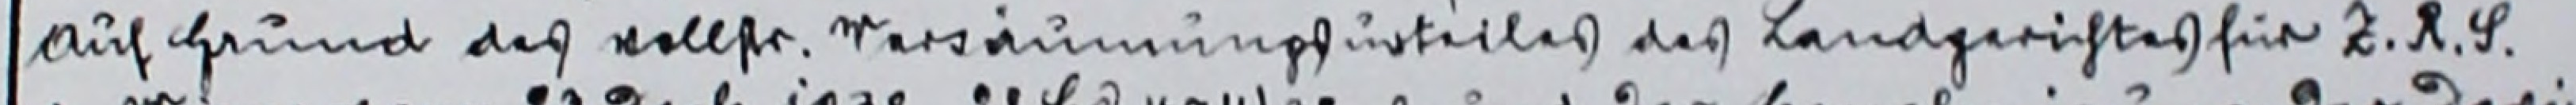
Auf Grund des vollstr. Versäumungsurteiles des Landgerichtes für Z.R.S.
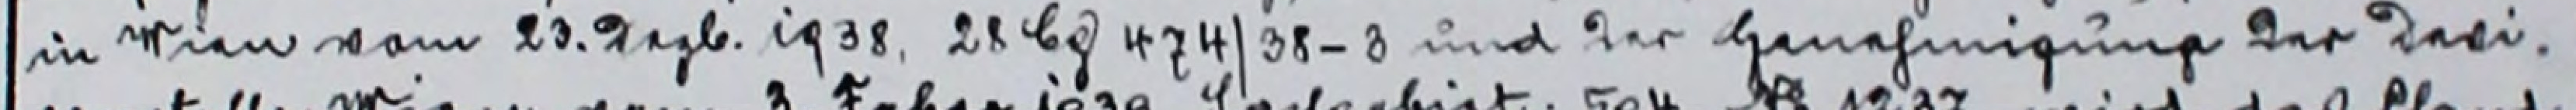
in Wien vom 23. Dezb. 1938, 286g 474/38 - 3 und der Genehmigung der Devi„
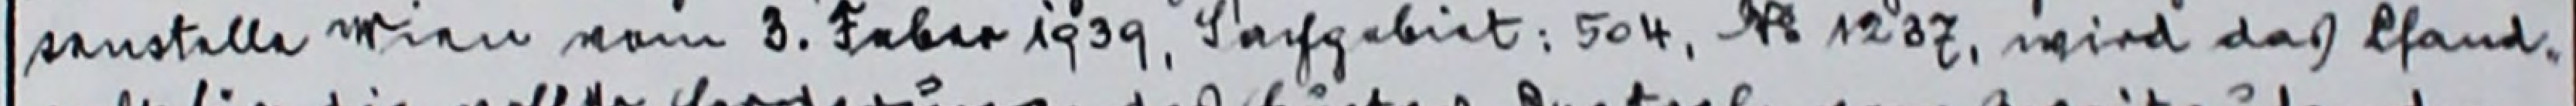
senstelle Wien vom 3. Feber 1939, Sachgebiet: 504, No 1237, wird das Pfand„
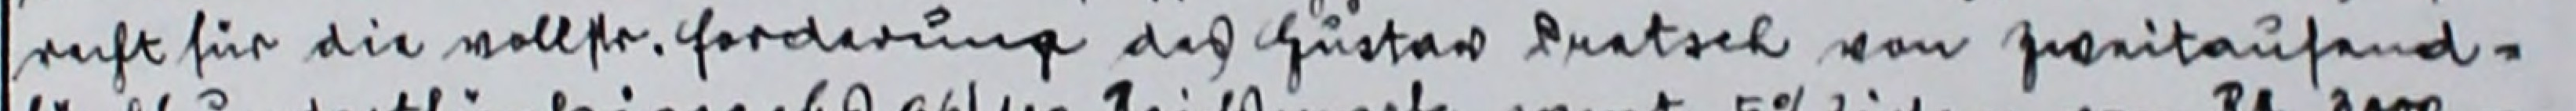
recht für die vollstr. Forderung des Gustav dretsch von Zweitausend„
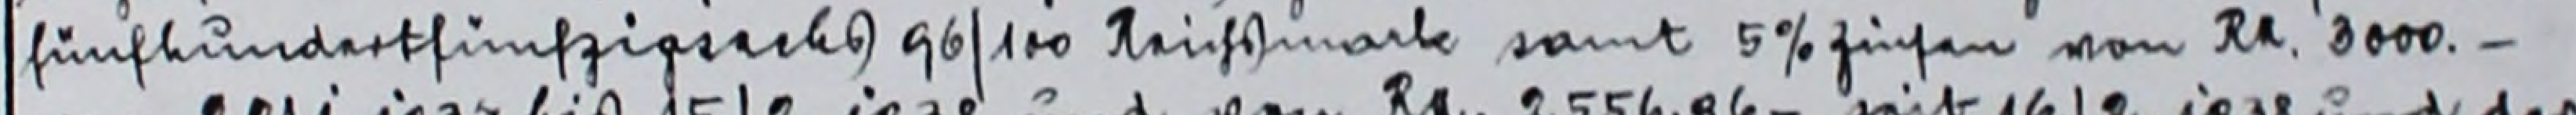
fünfhundertfünfzigsechs 96/100 Reichsmark samt 5 % Zinsen von Rm. 3000.-
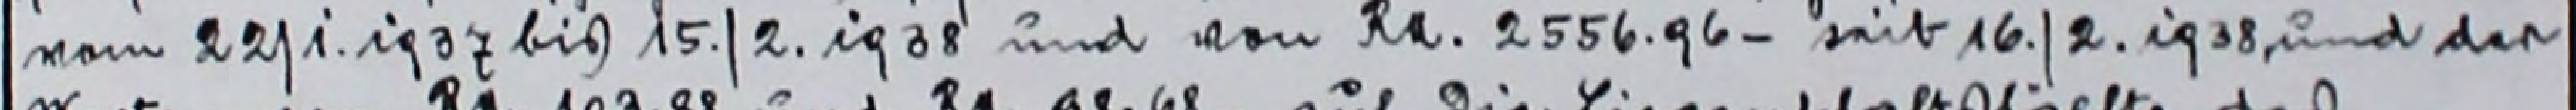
vom 22/1.1937 bis 15./2.1938 und von Rm. 2556.96 - seit 16./2.1938 und der
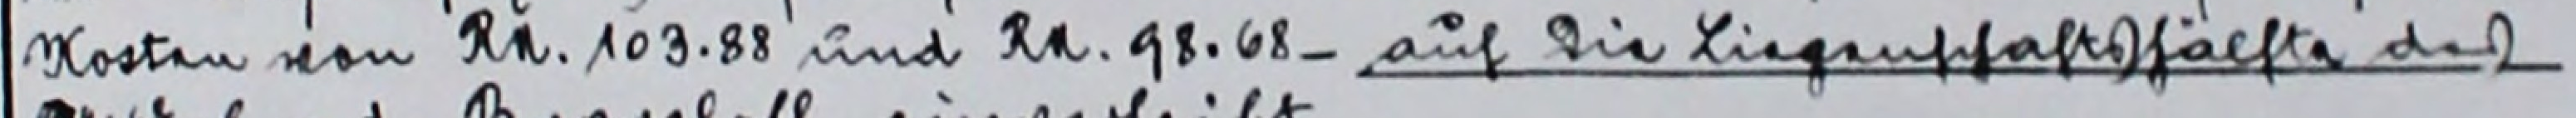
Kosten von Rm. 103.88 und Rm. 98.68 - auf die Liegenschaftshälfte des
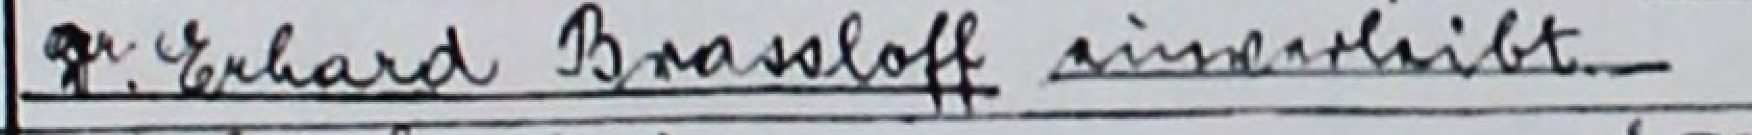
Dr. Erhard Brassloff einverleibt.
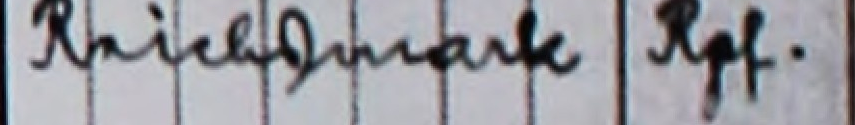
Reichsmark Rpf.
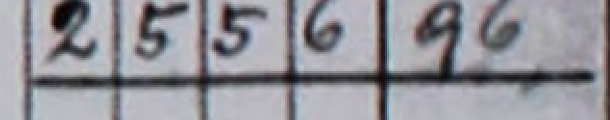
255696
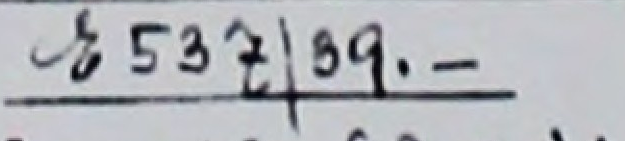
419/39, s. Septb. 1939, 419.-
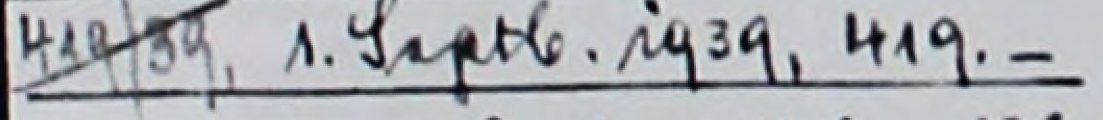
E 537/39.-
